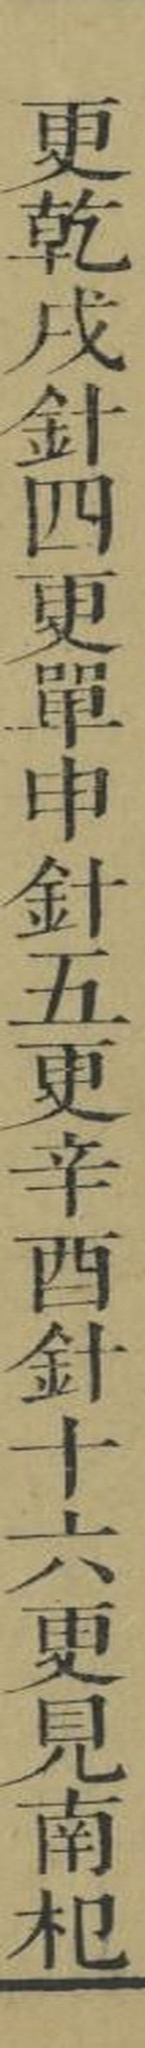更乾戌針四更單申針五更辛酉針十六更見南杞
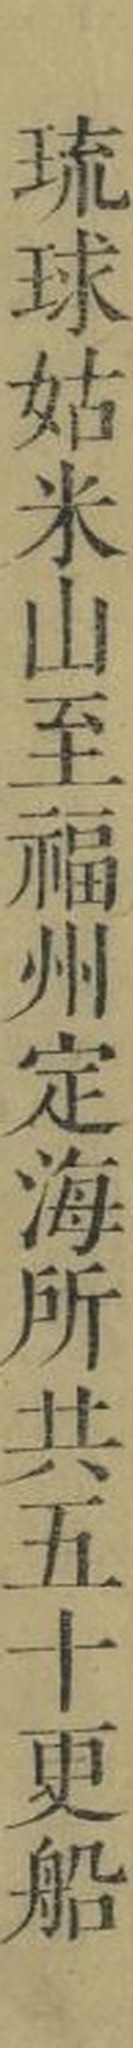琉球姑米山至福州定海所共五十更船
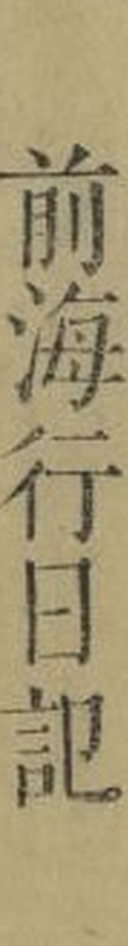前海行日記
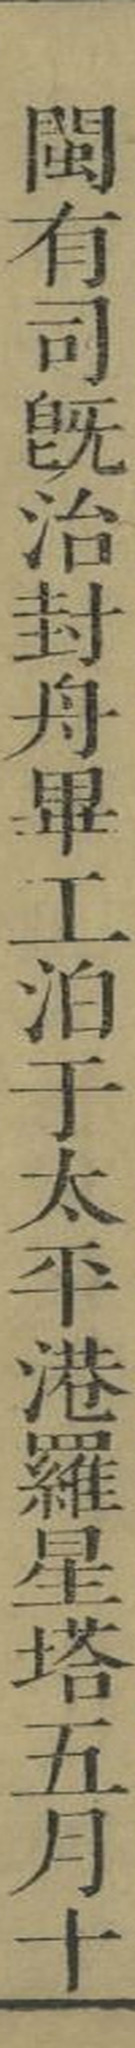閩有司既治封舟畢工泊于太平港羅星塔五月十
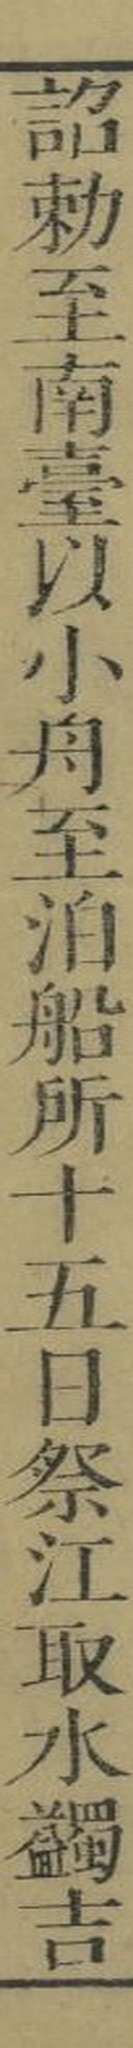詔勅至南臺以小舟至泊船所十五日祭江取水蠲吉

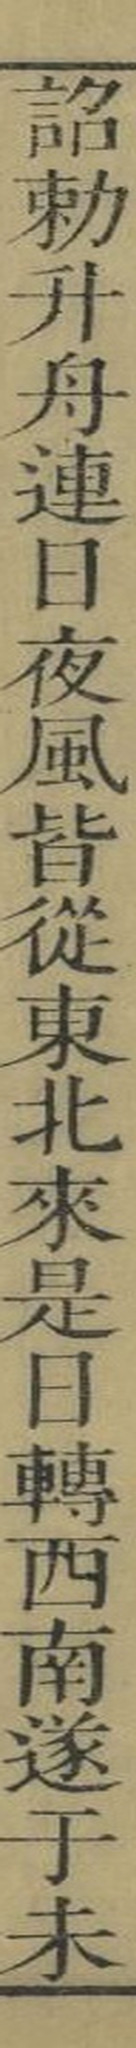詔勅升舟連日夜風皆從東北來是日轉西南遂于未
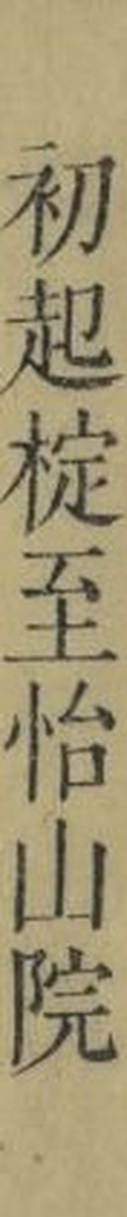初起椗至怡山院
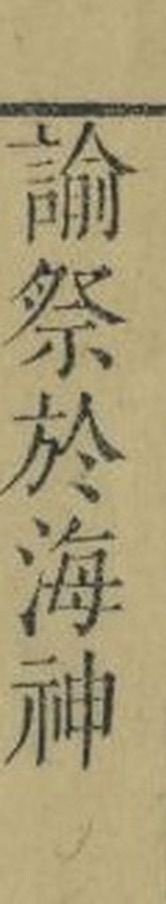諭祭於海神
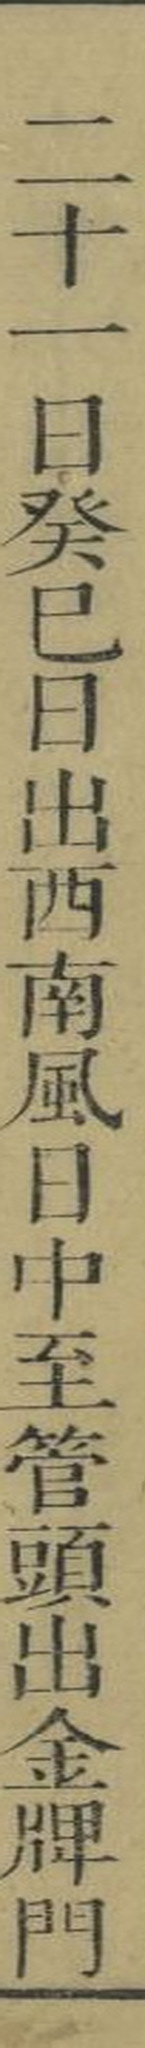二十一日癸巳日出西南風日中至管頭出金牌門
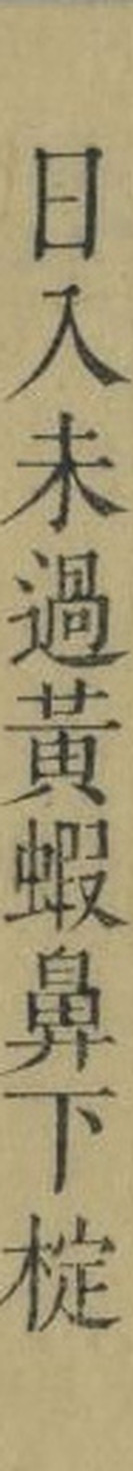日入未過黃蝦鼻下椗
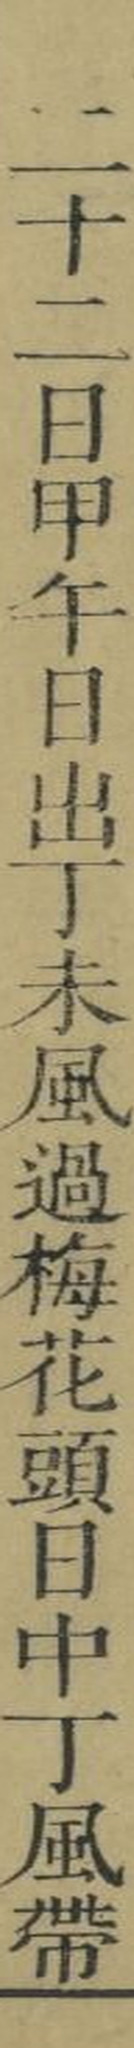二十二日甲午日出丁未風過梅花頭日中丁風帶
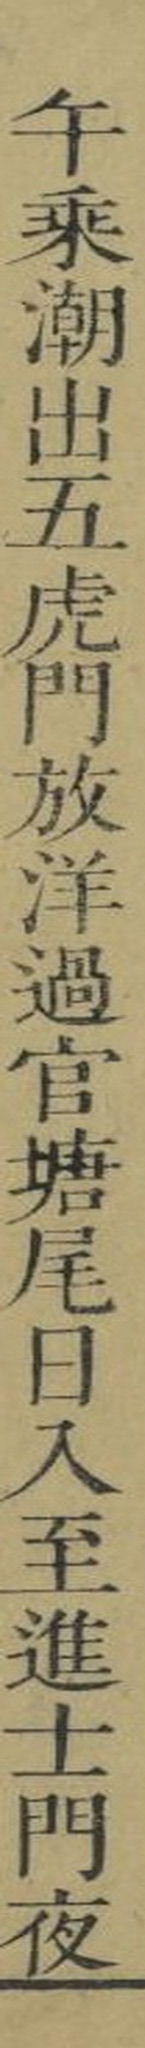午乘潮出五虎門放洋過官塘尾日入至進士門夜
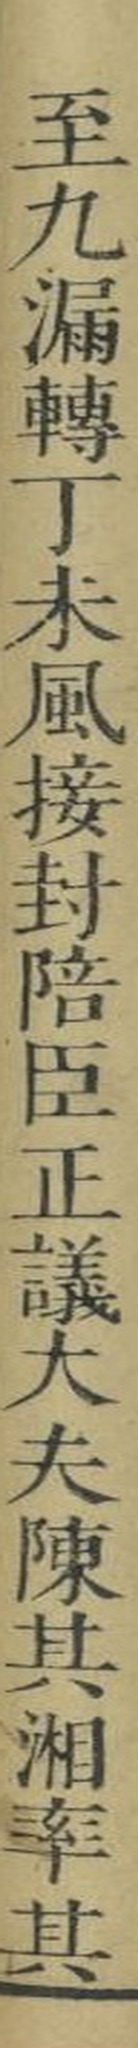至九漏轉丁未風接封陪臣正議大夫陳其湘率其
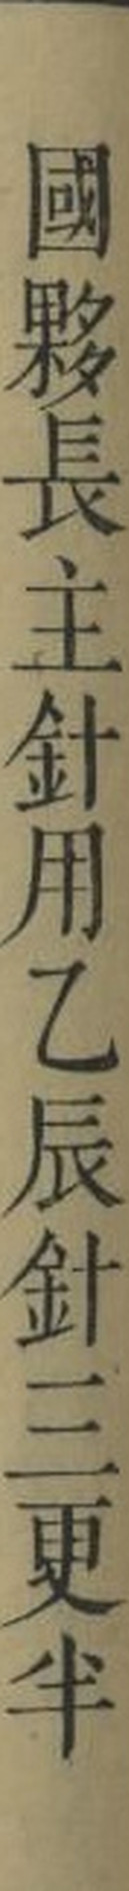國夥長主針用乙辰針三更半
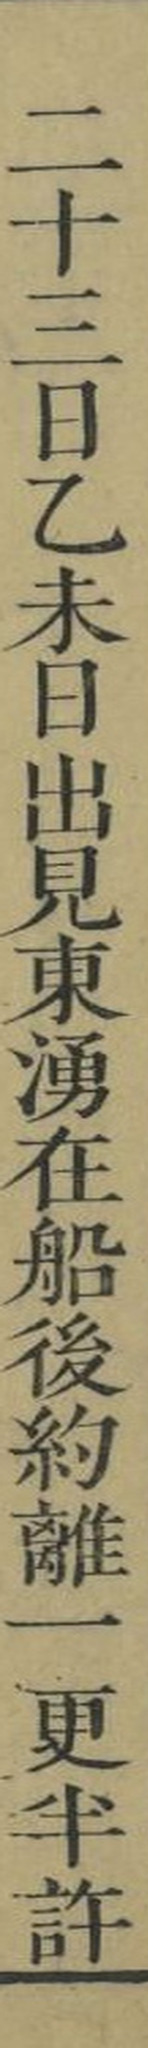二十三日乙未日出見東湧在船後約離一更半許
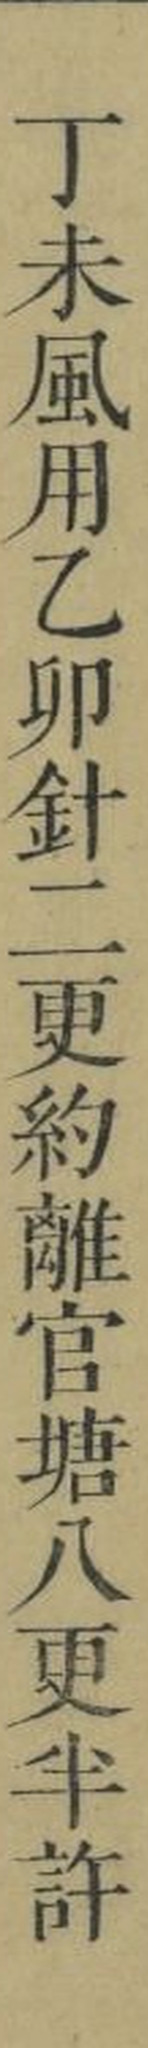丁未風用乙卯針二更約離官塘八更半許
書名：中山伝信録 巻一
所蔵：University of the Ryukyus Library
